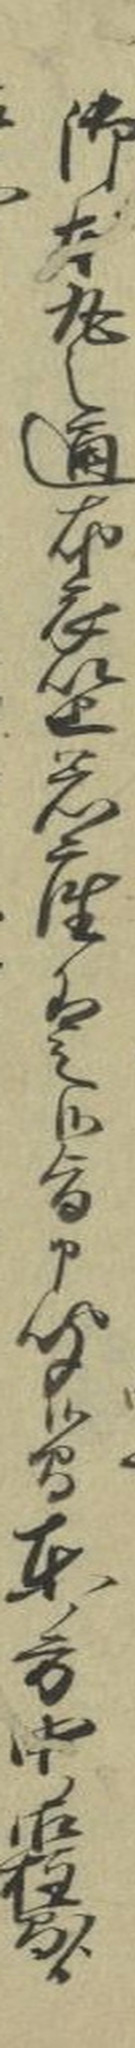御本丸之通布衣坐着座有之候旨申聞候間東の方中の御柱間ゟ
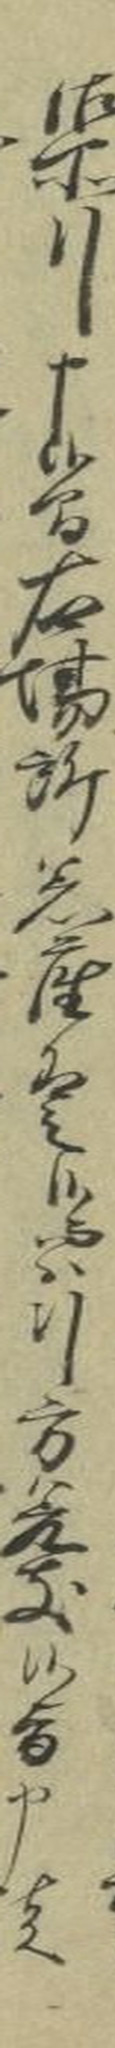御品引申候間右場所着座有之候ては引方差支候旨申談
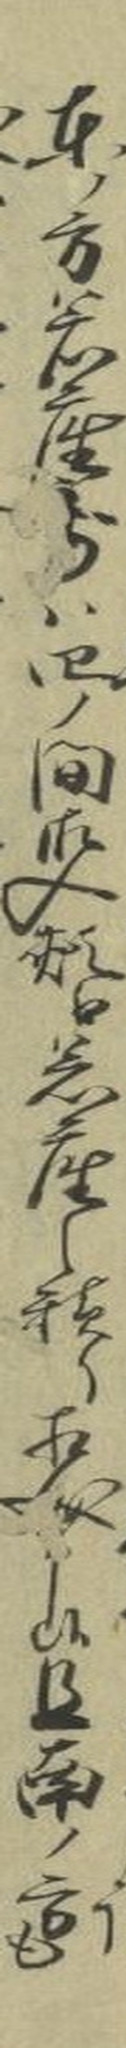東の方着座よりは四の間御入頬え着座之積り相成申候且南の方も
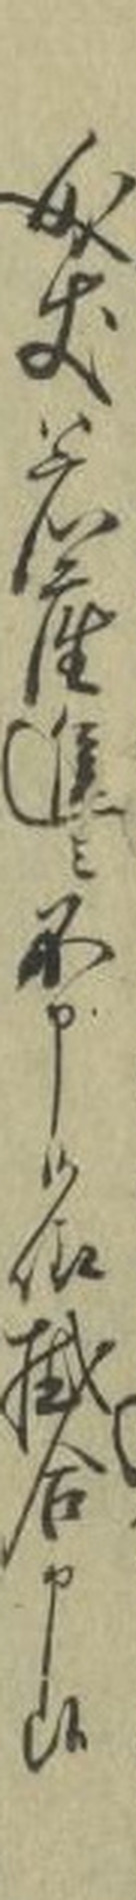成丈着座進み不申候様掛合申候
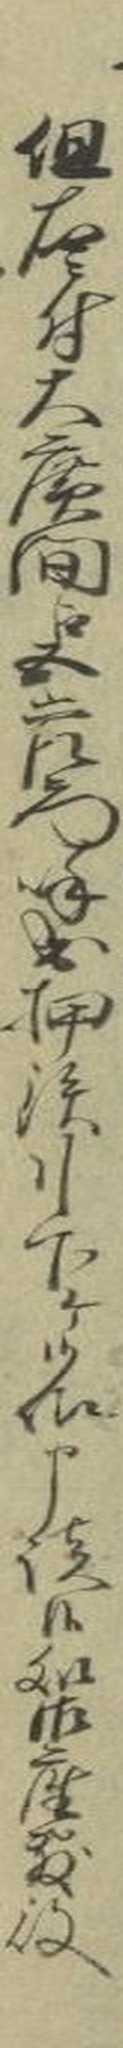但右に付大広間え五六左衛門呼出押鉄引下け候様申談候処御座敷役
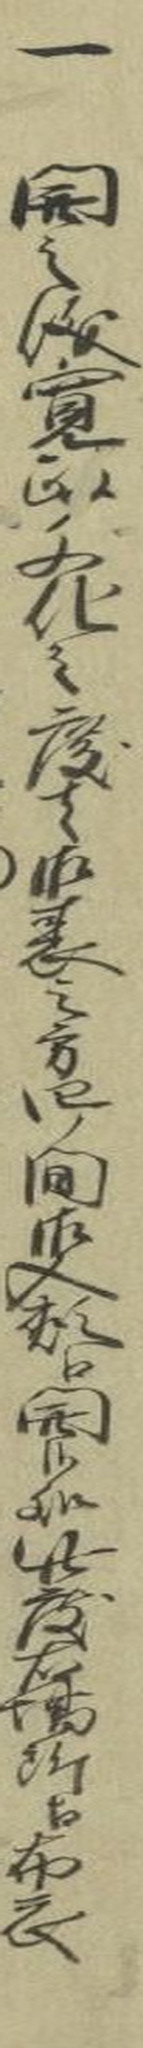一開之儀寛政文化之度は御表之方四之間御頬え開候処此度右場所え布衣
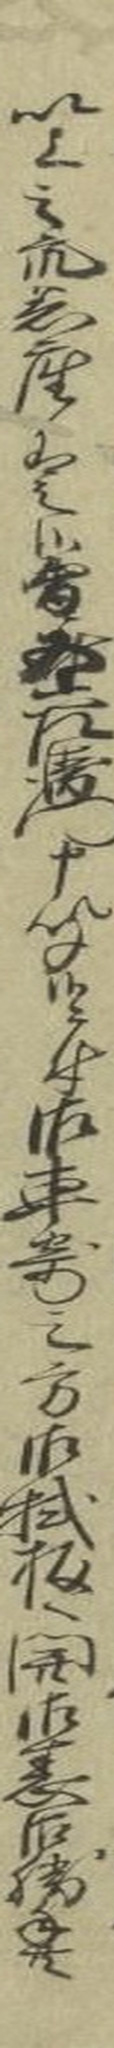以上之衆着座有之候旨五六左衛門申聞候に付御車寄之方御拭板へ開御裏御勝手共
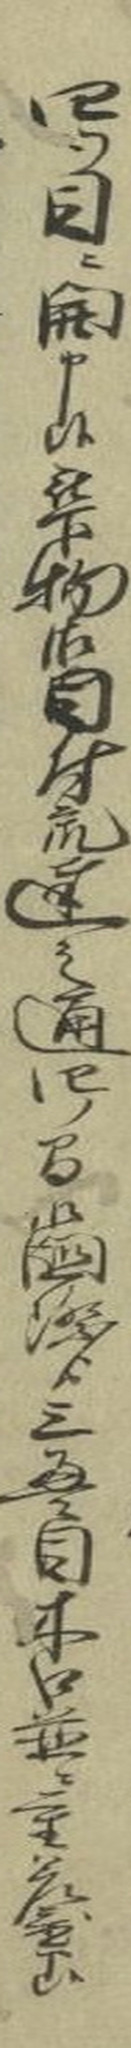四つ目に開申候被下物御目付衆達之通四の間御閾際ゟ三畳目木口並に重差置申候
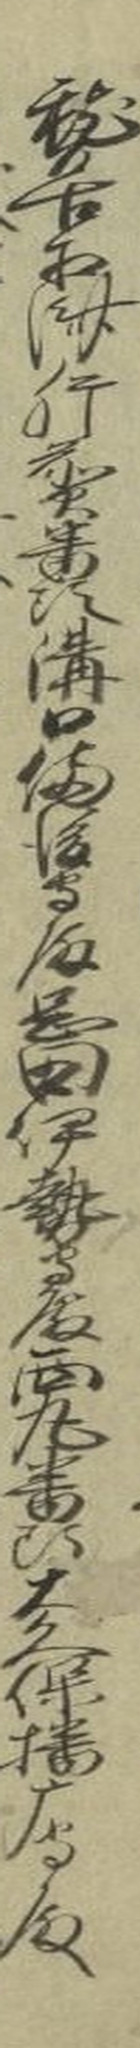一稽古相済肝煎番頭溝口備後守殿岡田伊勢守殿西丸番頭大久保播磨守殿
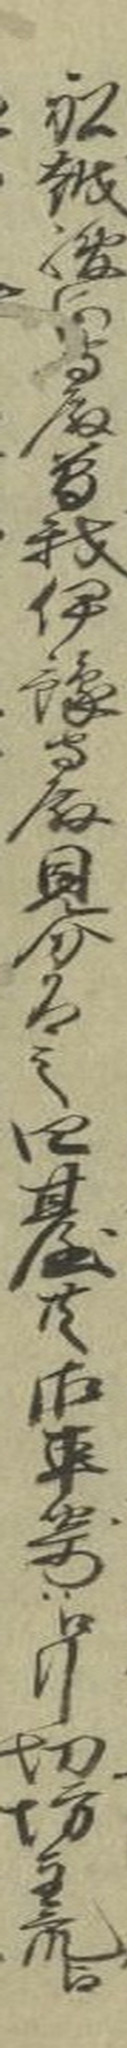船越駿河守殿曽我伊予守殿見分有之四台共御車寄え引切坊主衆え
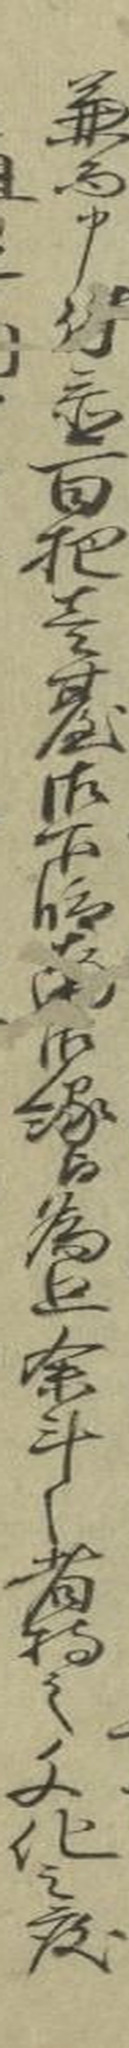兼て申付置百把壱台御下段南御縁え為廻余計之者持之文化之度
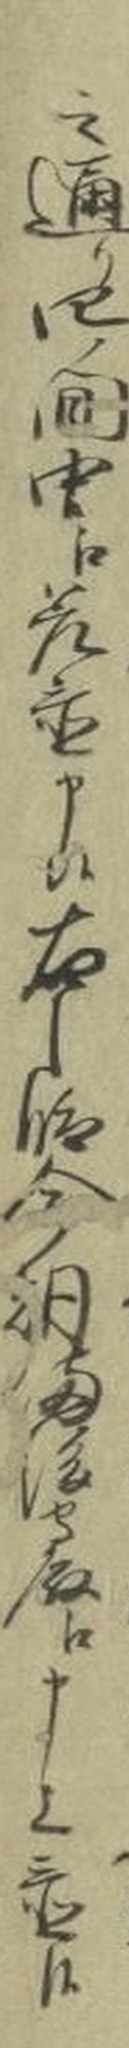之通り四の間中え差置申候右之段今朝備後守殿え申上置候

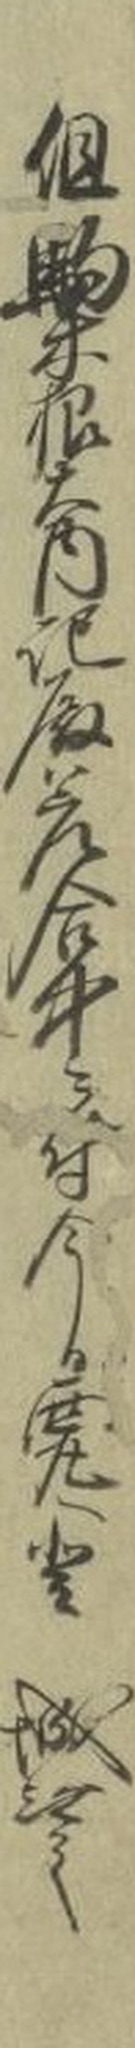但駒木根大内記殿差合中に付今日西丸へ登城無之
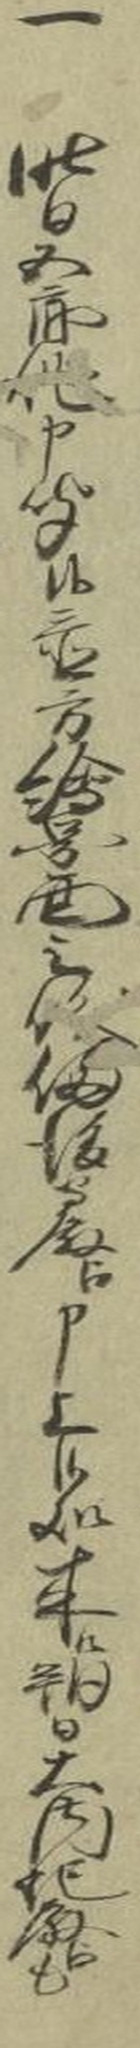一昨日五郎作申聞候置方絵図面之儀備後守殿え申上候処来る朔日大内記殿えも
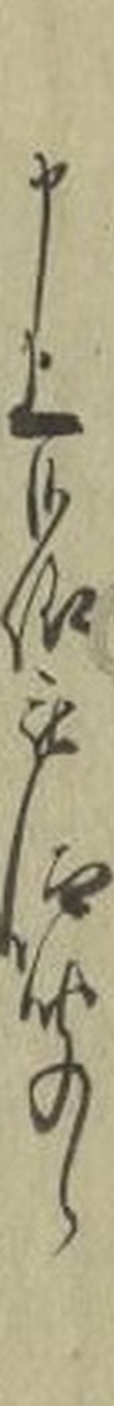申上候様被仰聞候
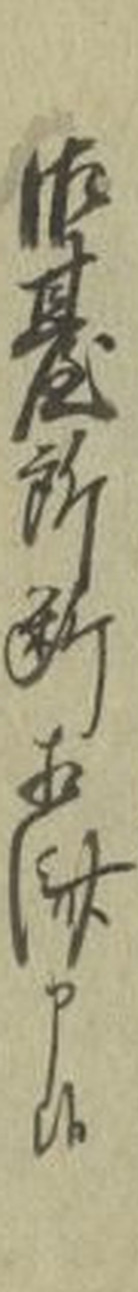一御台所断相済申候
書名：天保三壬辰年琉球人参府之節勤方書留
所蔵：University of the Ryukyus Library
